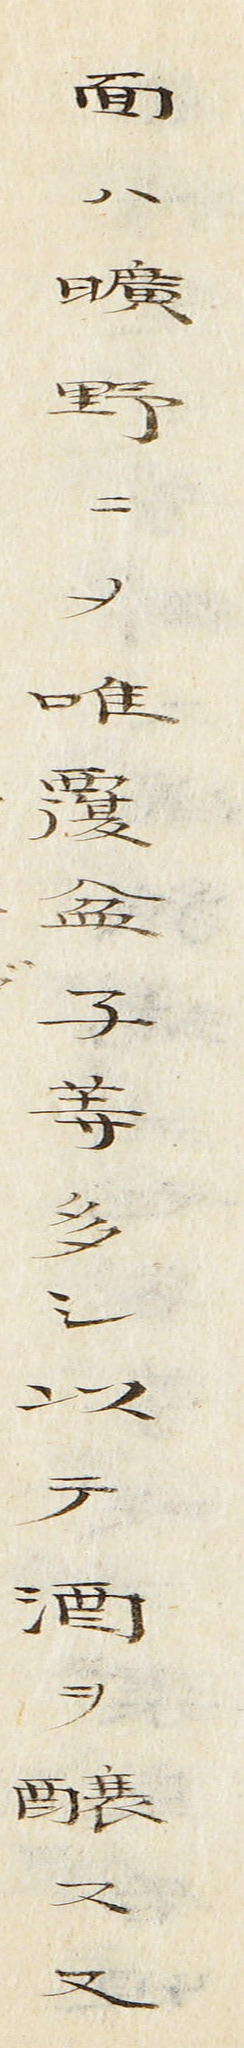面ハ曠野ニシテ唯覆盆子等多シ以テ酒ヲ醸ス又
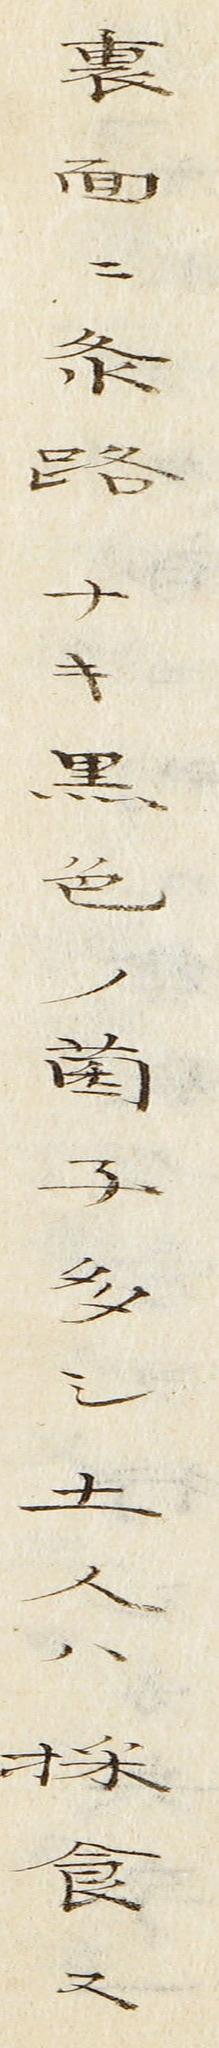裏面ニ条路ナキ黒色ノ菌子多シ土人ハ採食ス
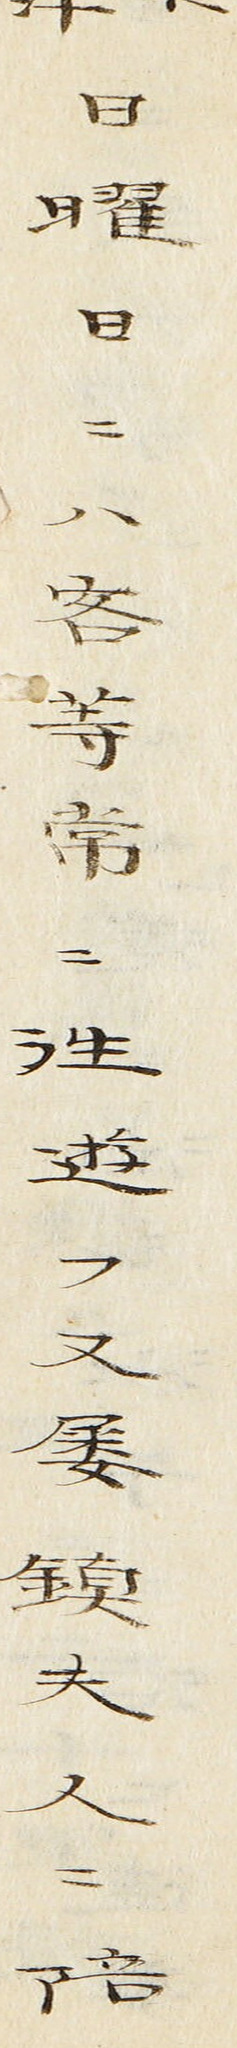不詳日曜日ニハ客等常ニ往遊フ屡鎮夫人ニ陪
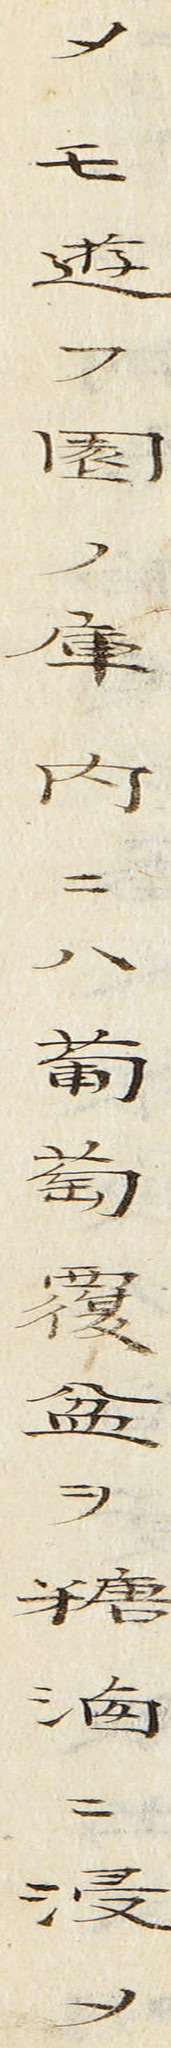シテモ遊フ園ノ庫内ニハ葡萄覆盆ヲ糖滷？ニ浸シテ
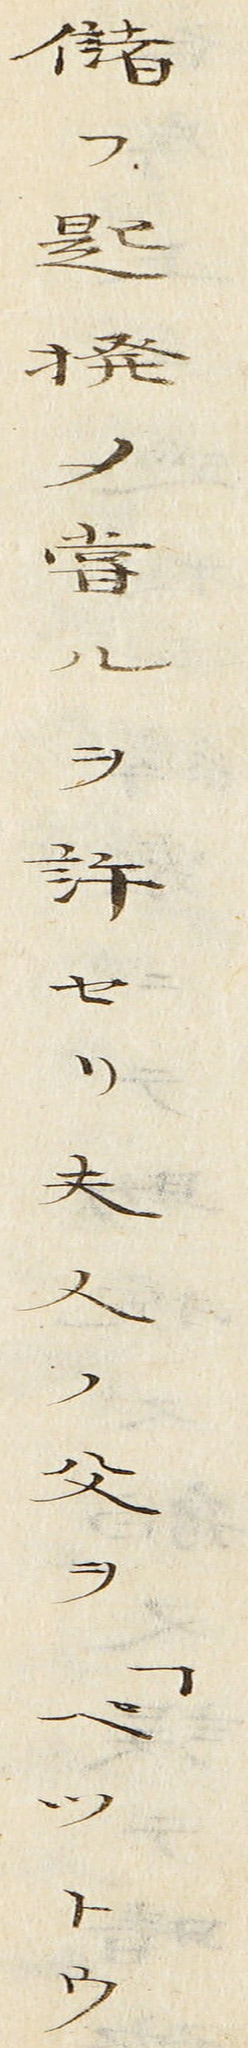儲フ匙撥シテ嘗ルヲ許セリ夫人ノ父ヲ「ペツトウ
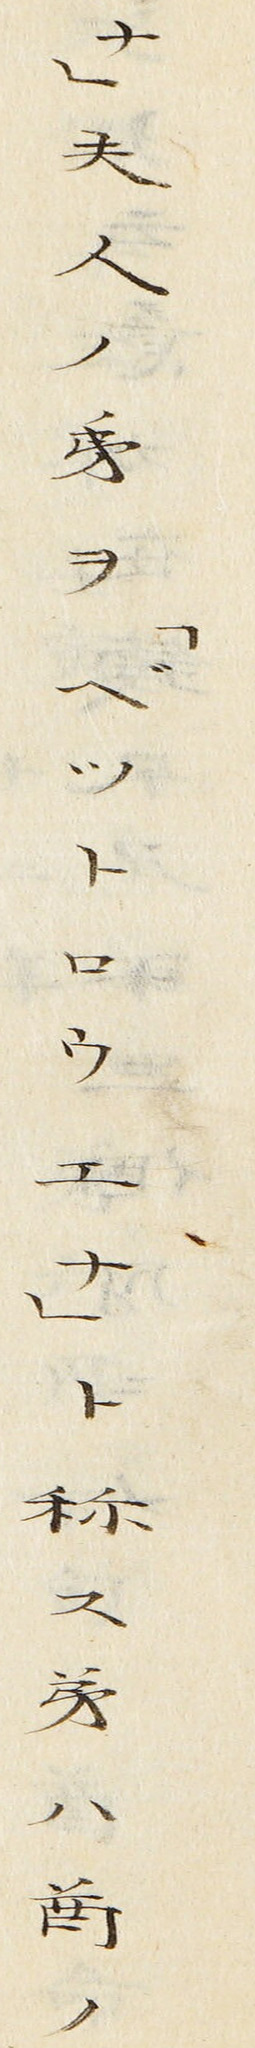ナ」夫人ノ弟ヲ「ペツトロウエナ」ト称ス弟ハ酋ノ
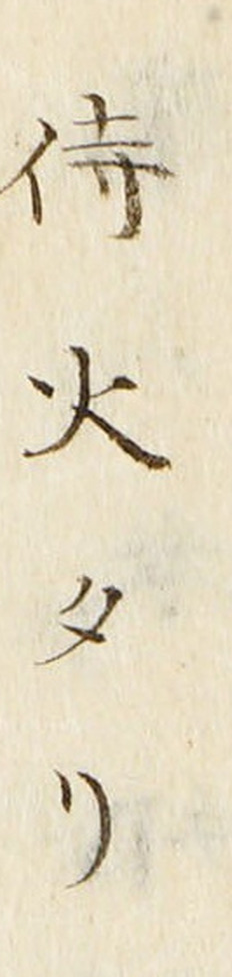侍火タリ
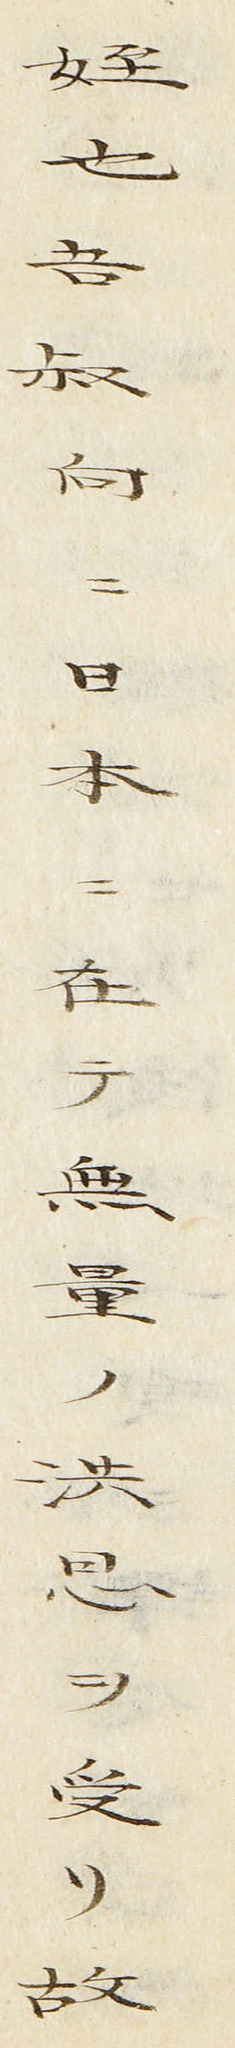姪也吾叔向ニ日本ニ在テ無量ノ洪思ヲ受リ故
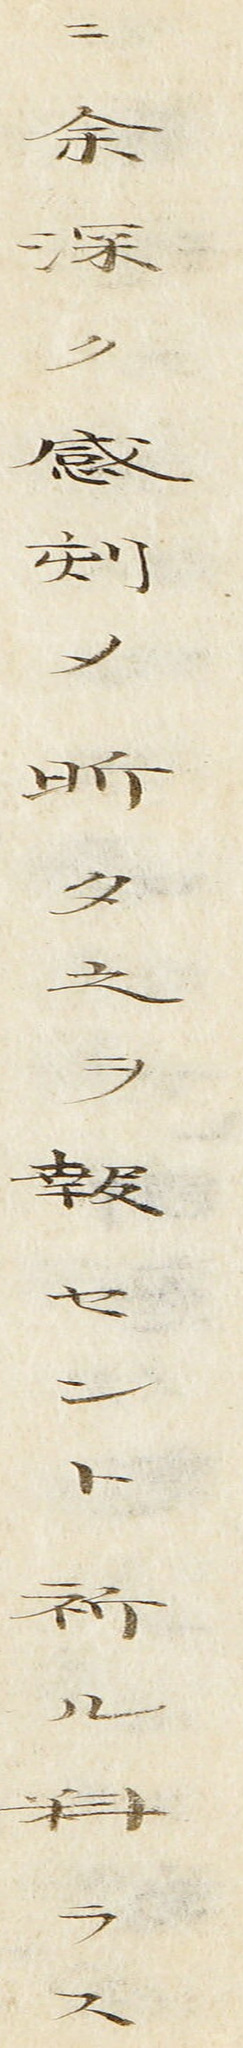ニ余深ク感シテ昕タ之ヲ報セント祈ル料ラス
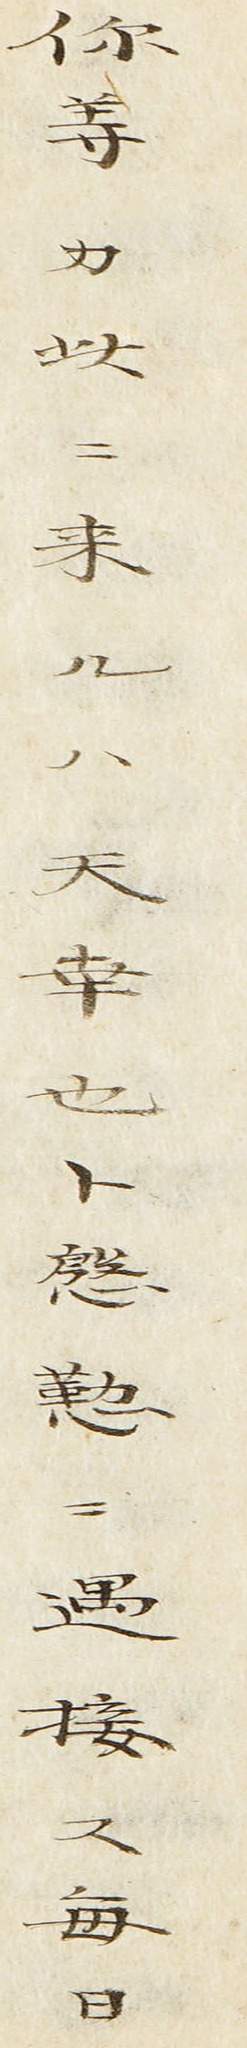你等カ此ニ来ルハ天幸也ト慇懃ニ遇接ス毎日
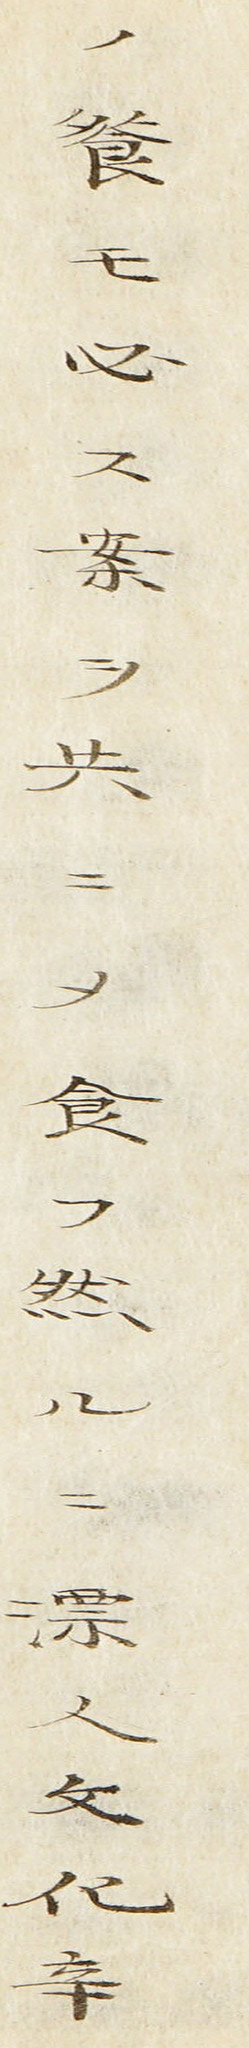ノ饗モ必ス案ヲ共ニシテ食フ然ルニ漂人文化辛
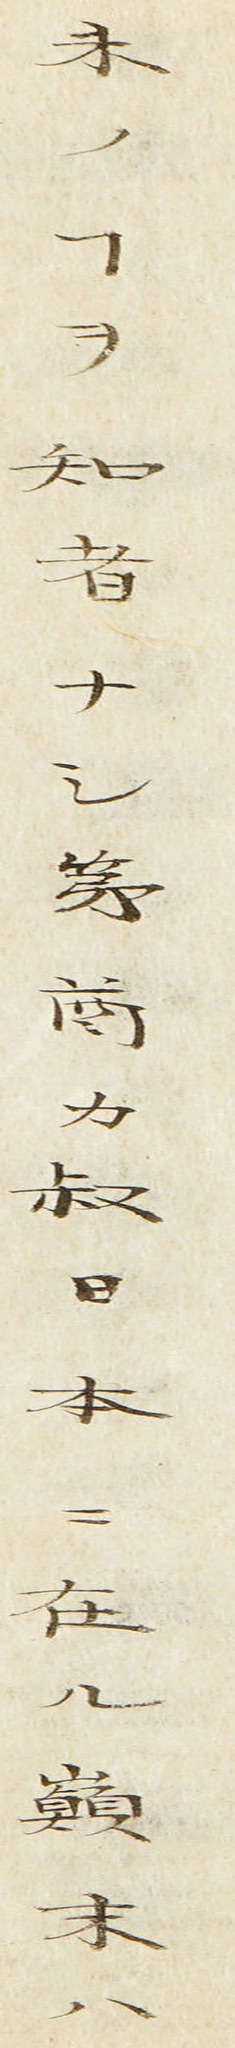未ノコトヲ知者ナシ第酋カ叔日本ニ在ル巓末ハ
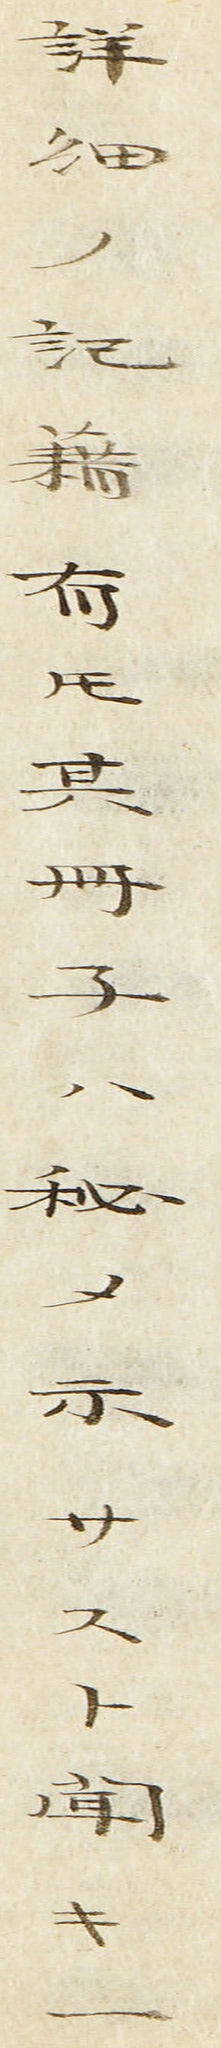詳細ノ記籍有ドモ其冊子ハ秘メ示サスト聞キ一
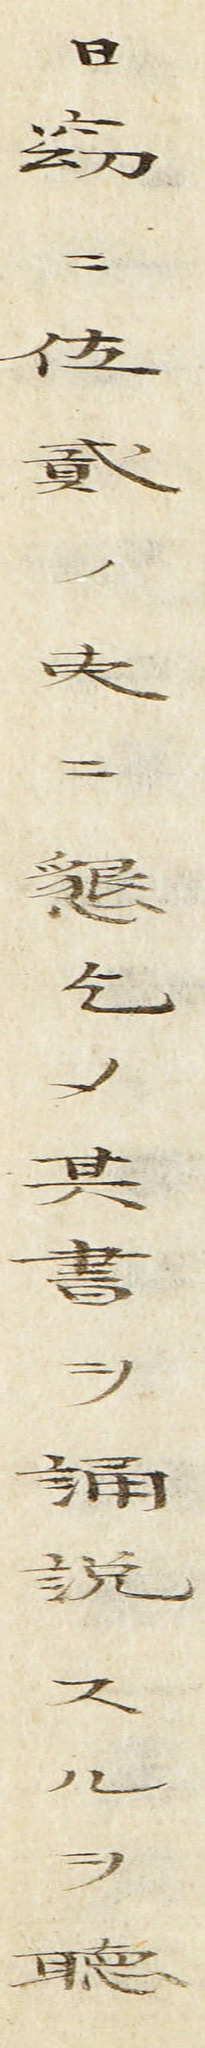日窈ニ佐貳ノ吏ニ懇幸乞シテ其書ヲ誦説スルヲ聴

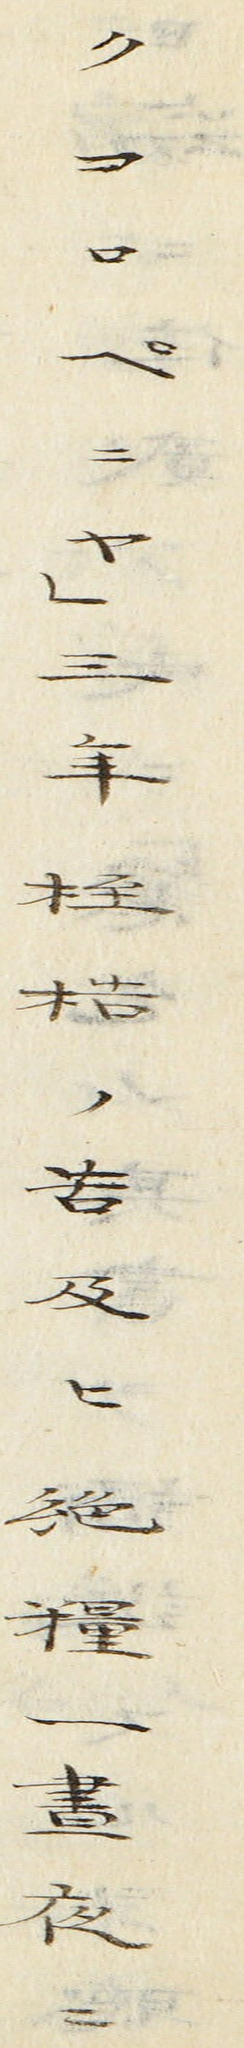クコロペニア」三年桎梏ノ苦及ヒ絶糧一昼夜ニ
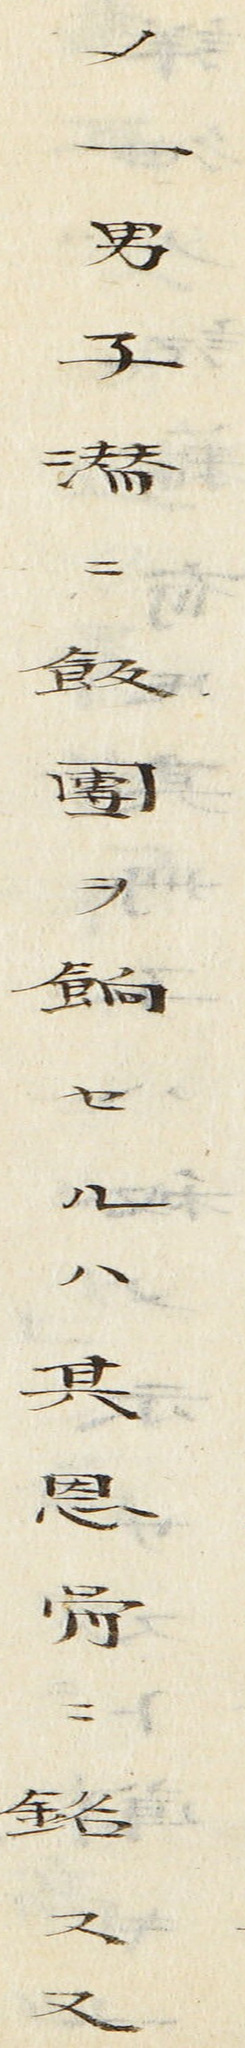シテ一男子潜ニ飯団ヲ餉セルハ其恩骨ニ銘ス又
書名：蕃談
